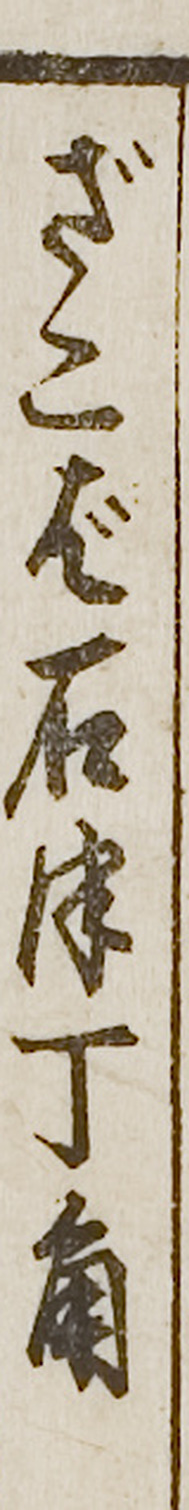ざこば石津丁角
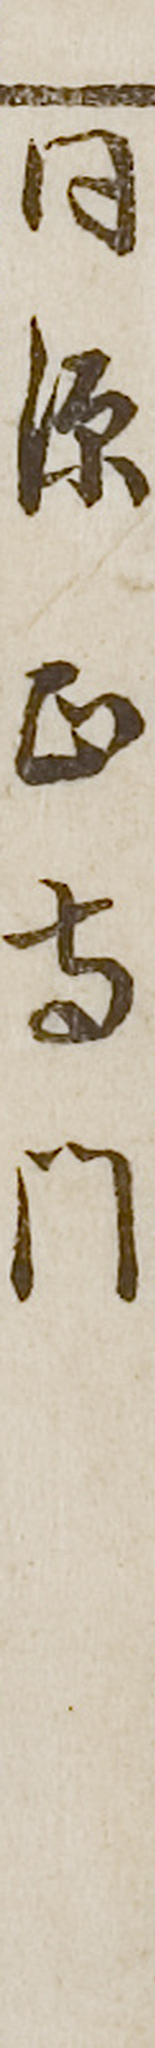同源正寺門
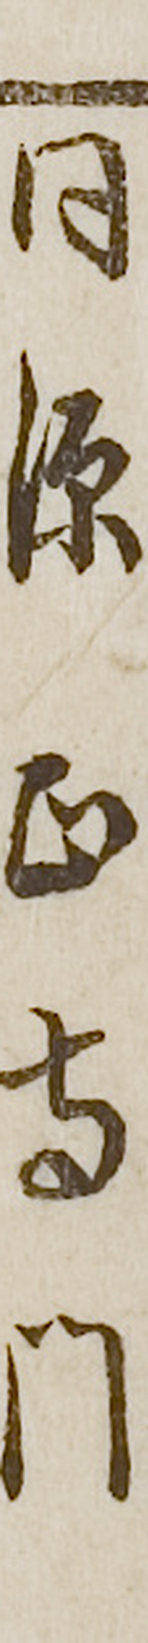同源正寺門
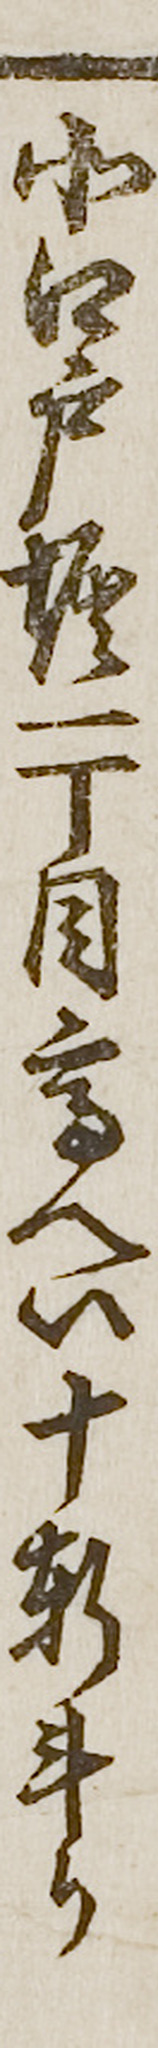北江戸堀一丁目高へい十軒斗り
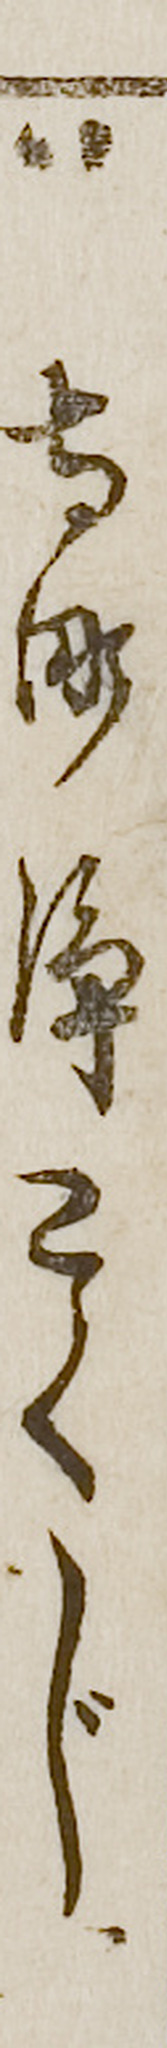〃寺町浄こくじ
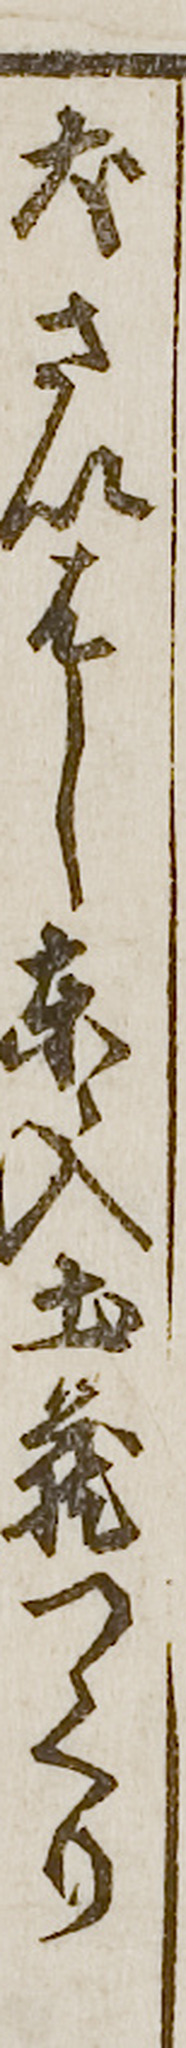犬さいはし東入土蔵つくり
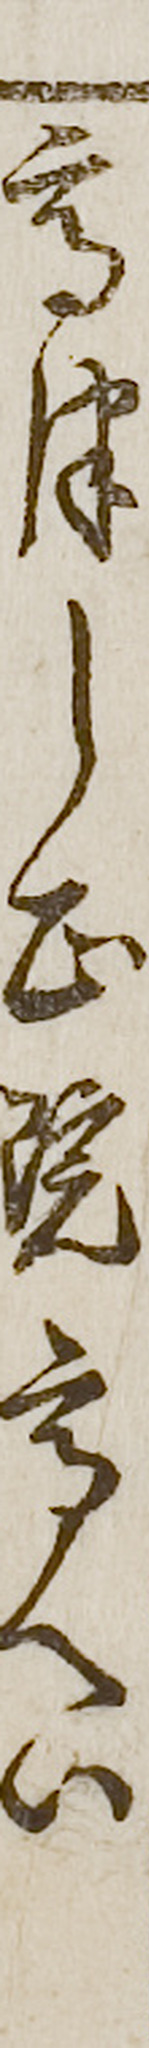高津し正院高へい
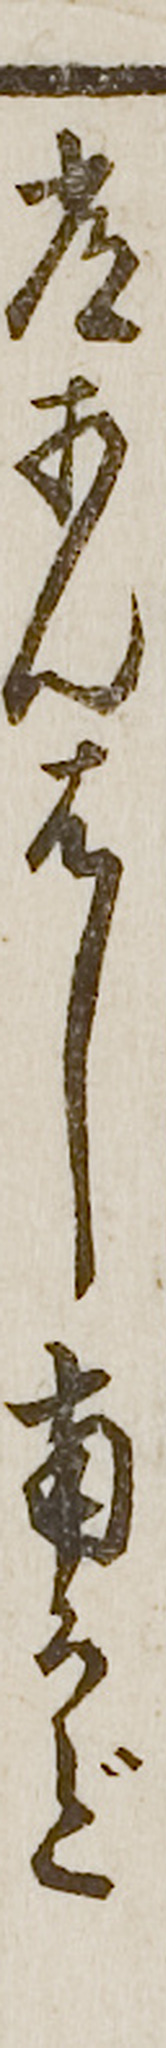常あんはし南かど
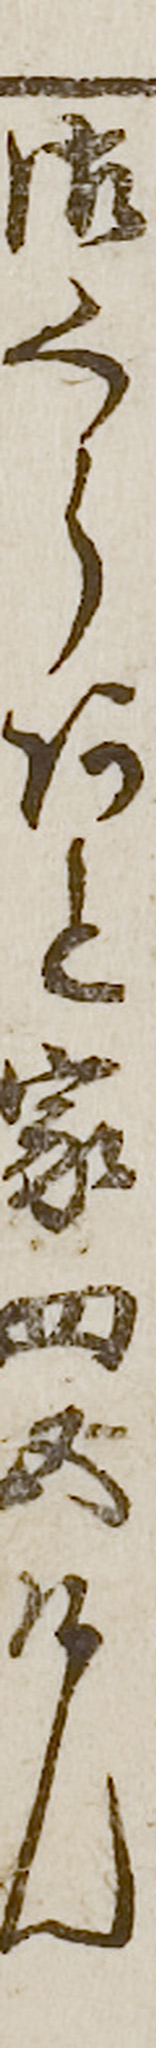御くらあと家四五軒
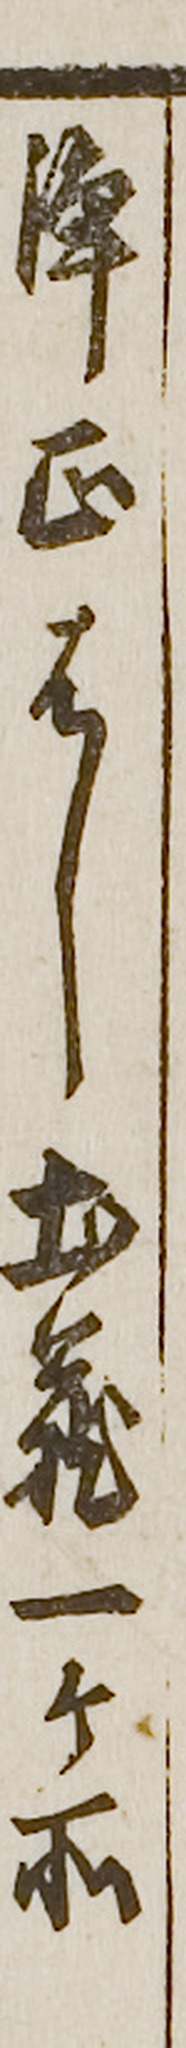浄正はし土蔵一ヶ所
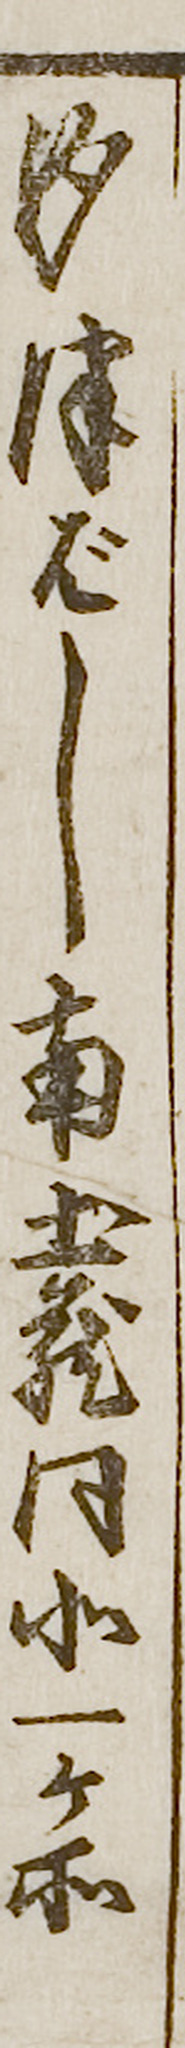汐津ばし南土蔵同北一ヶ所
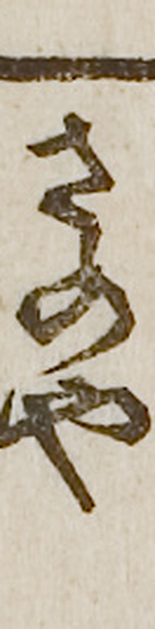さのや
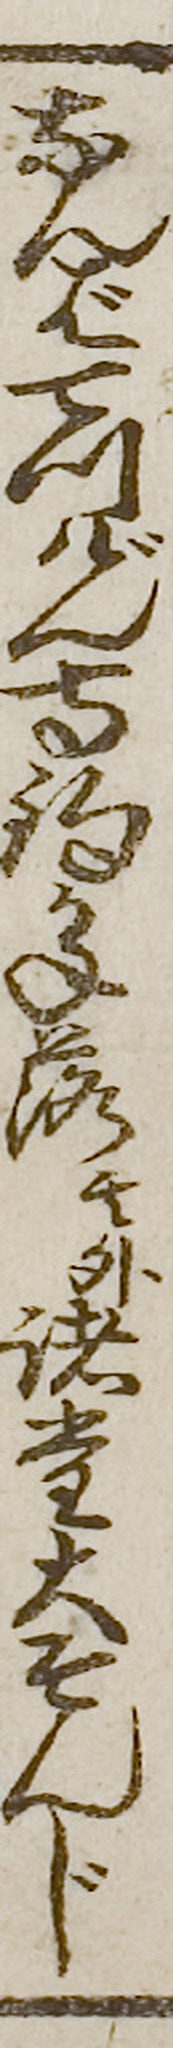なんばてつげん寺釣かね落其外諸堂大そんじ
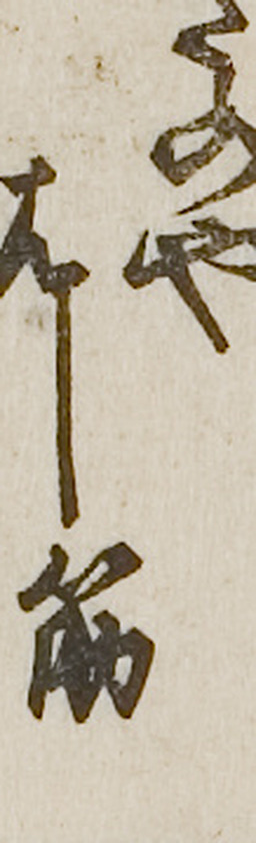はし筋
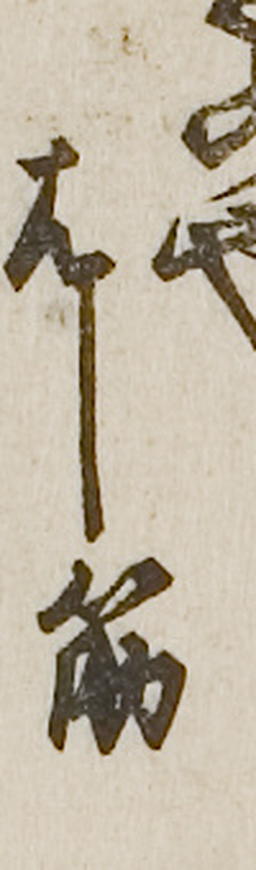はし筋
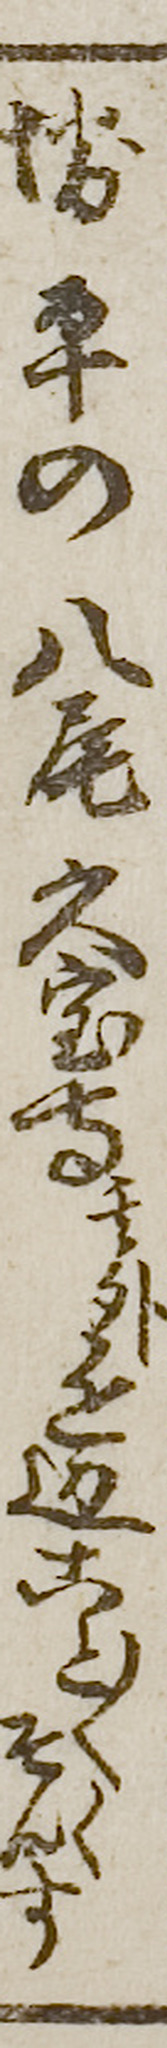堺平の八尾久宝寺其外近辺こと〳〵くそんす
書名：摂津大ぢしん
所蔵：東京大学総合図書館 General Library in the University of Tokyo, JAPAN
